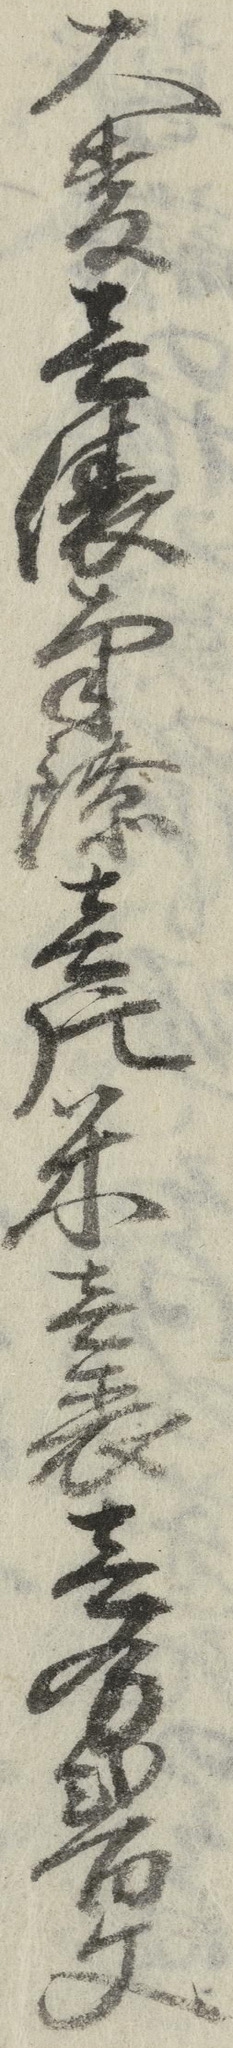大麦壱俵南鐐壱片米壱表壱分弐百文
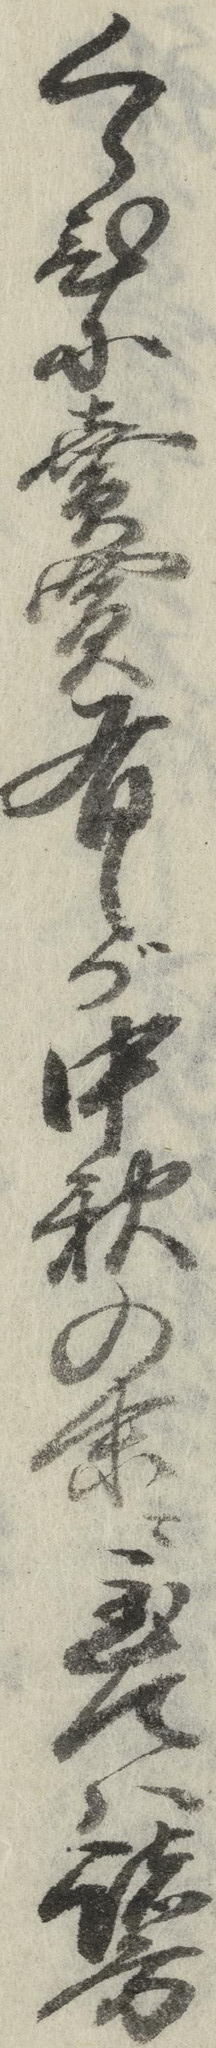くらひに売買有しが中秋の末に至ては諸方
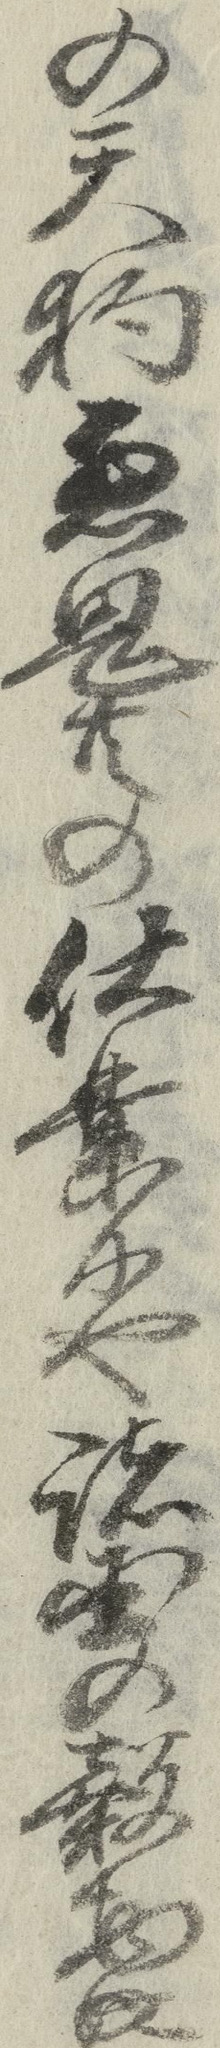の天狗悪鬼共の仕業にや諸国の穀物は
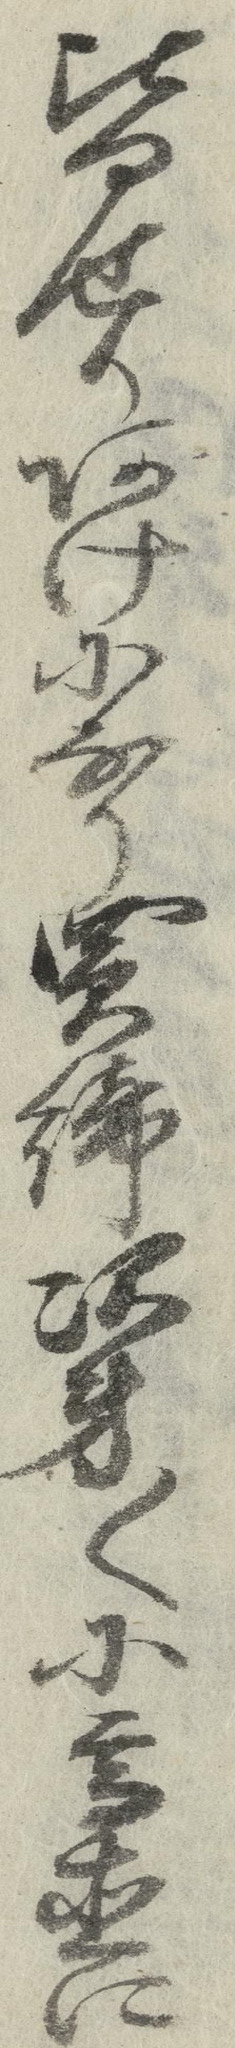皆せりあけになり買締次第〳〵に高直に
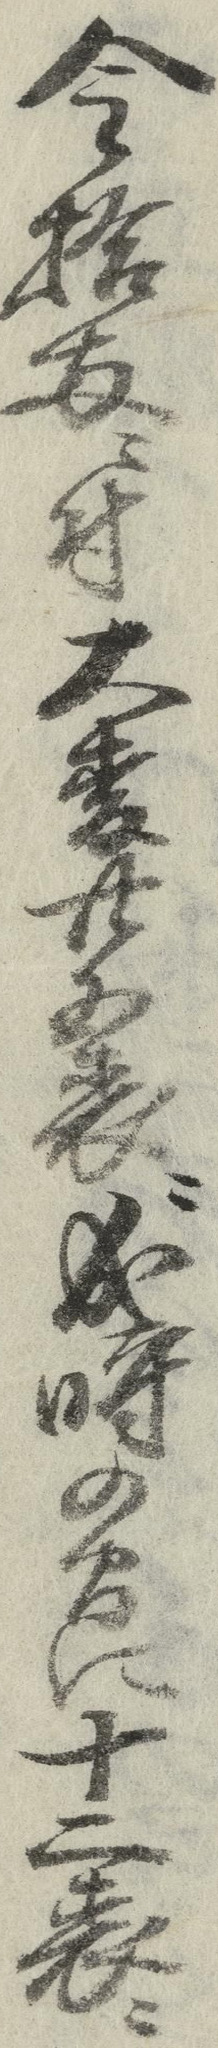金拾両に付大麦廿五表に成時の間に十二表に
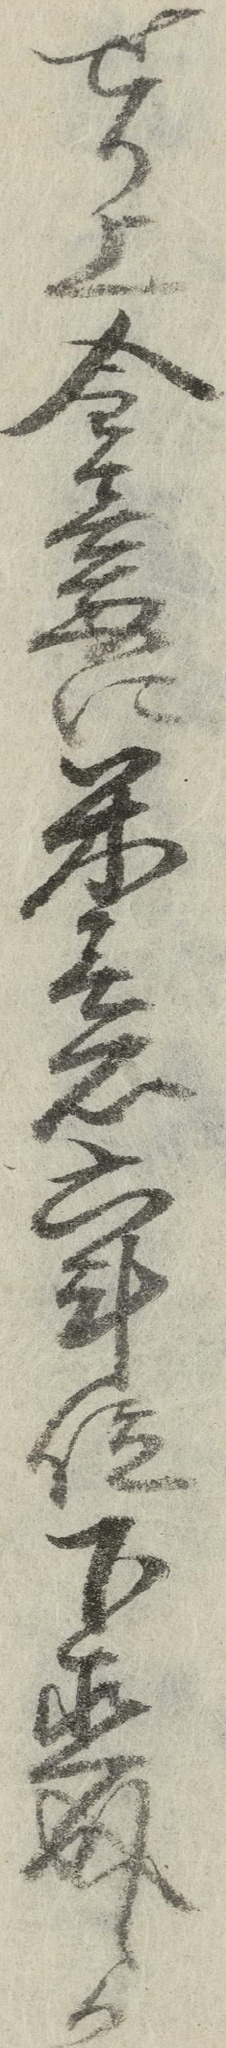せり上金壱両に米壱石六斗位下直成しか
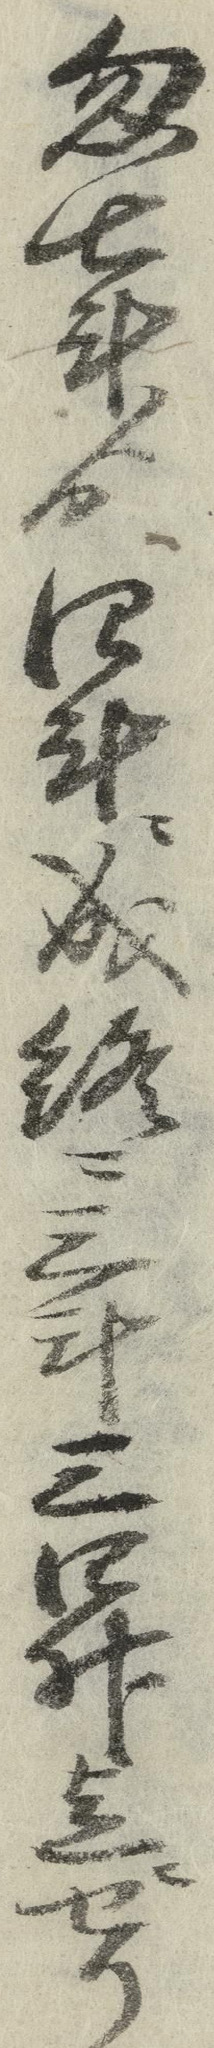忽七斗ゟ四斗に成終に三斗三四升迄にセり

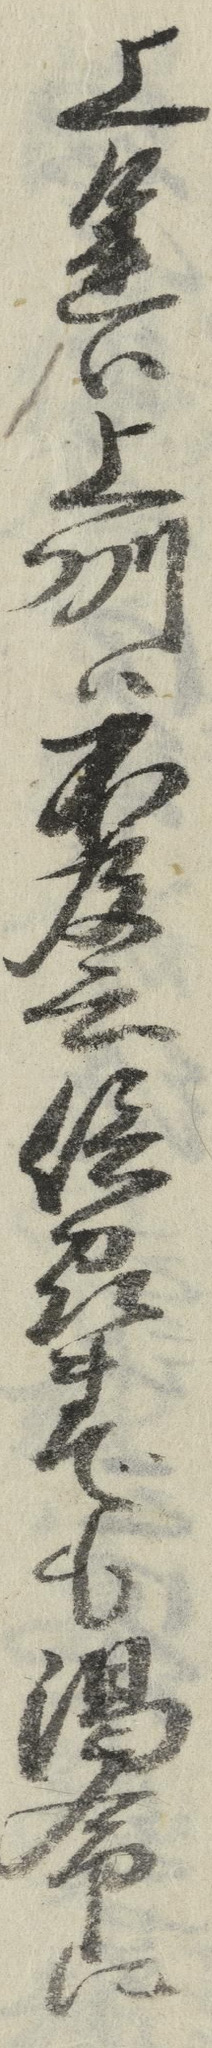上れは上州は不及云信州までも渇命に
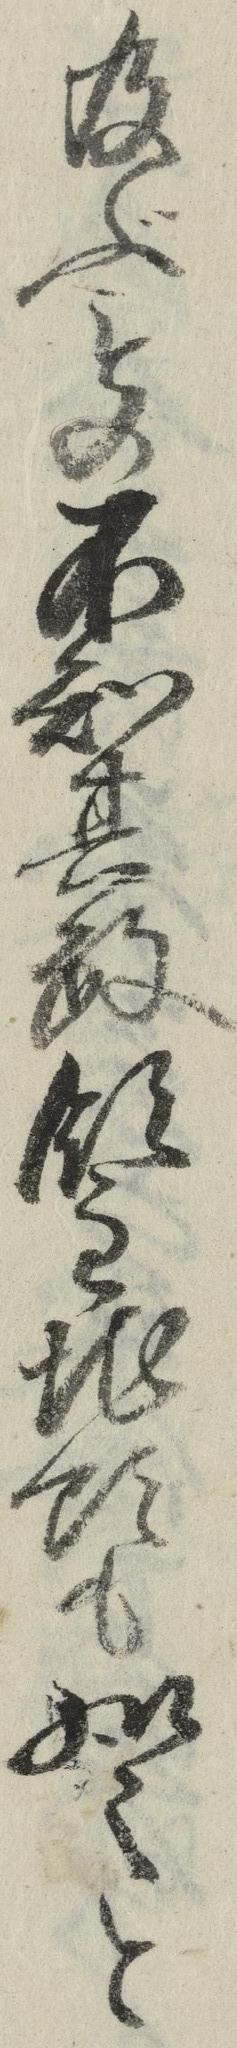及ぶもの不知其数領主地頭も処々と
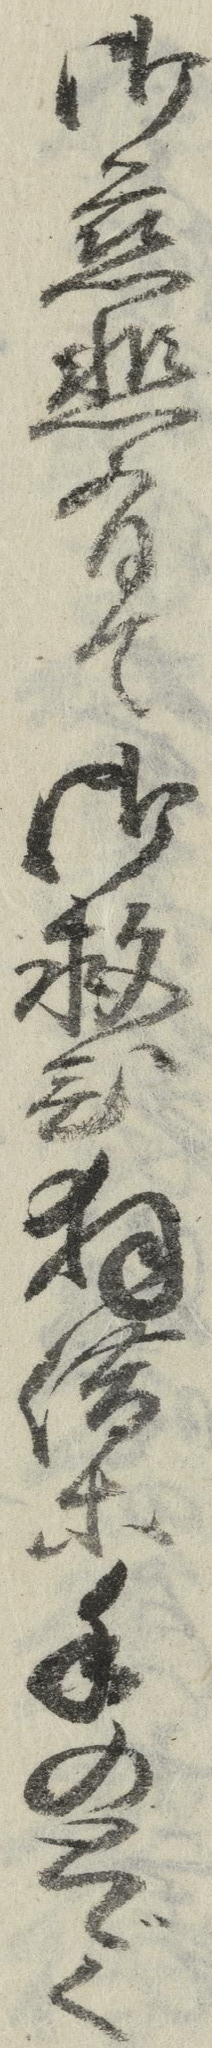御慈悲有て御救ひ拝借等手のとゞく
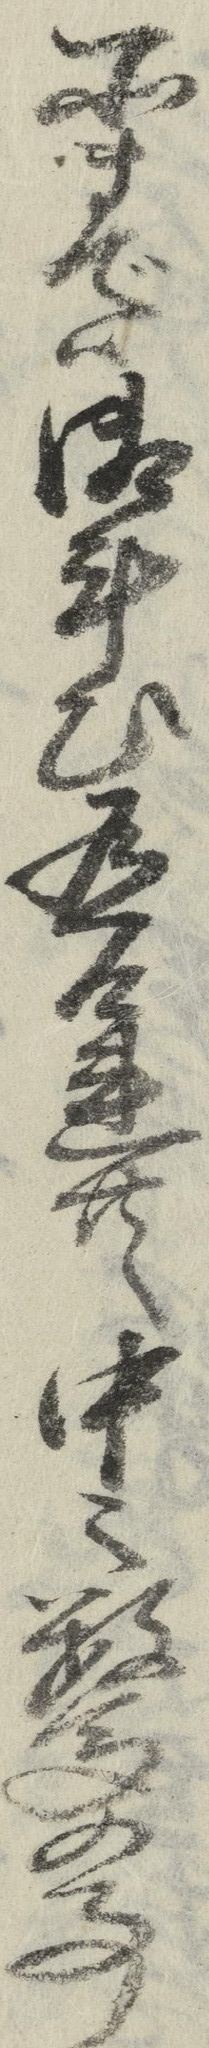所までは御計ひ有けれ共中々数多の事
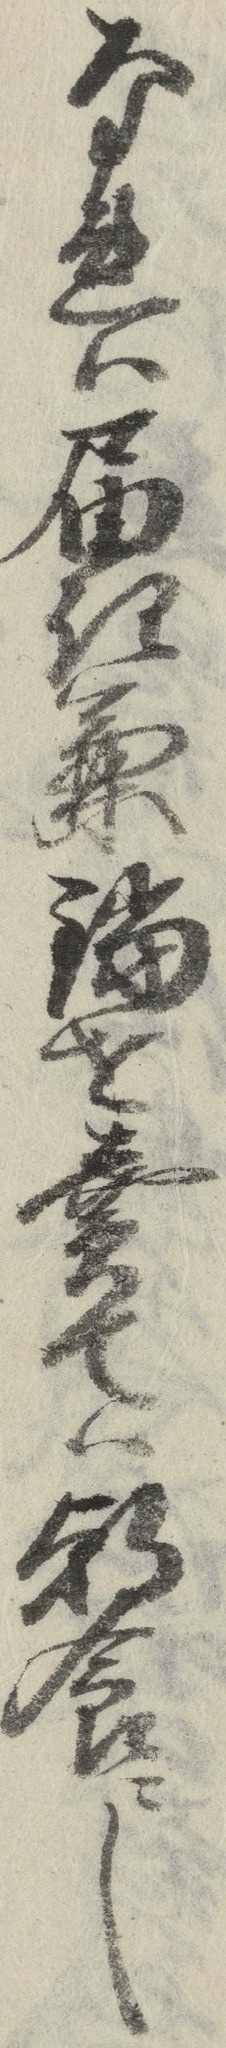なれは届き兼鐺を売ては朝食にし
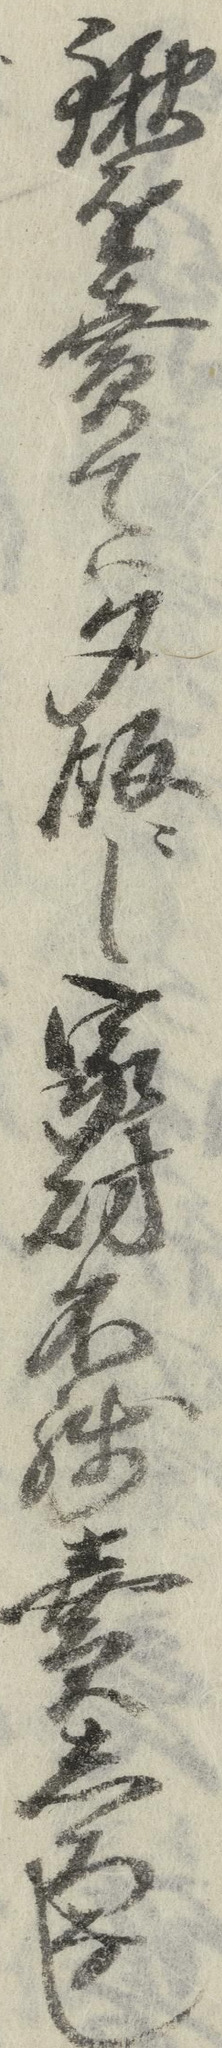鍬を売ては夕飯にし家財不残売しろなし
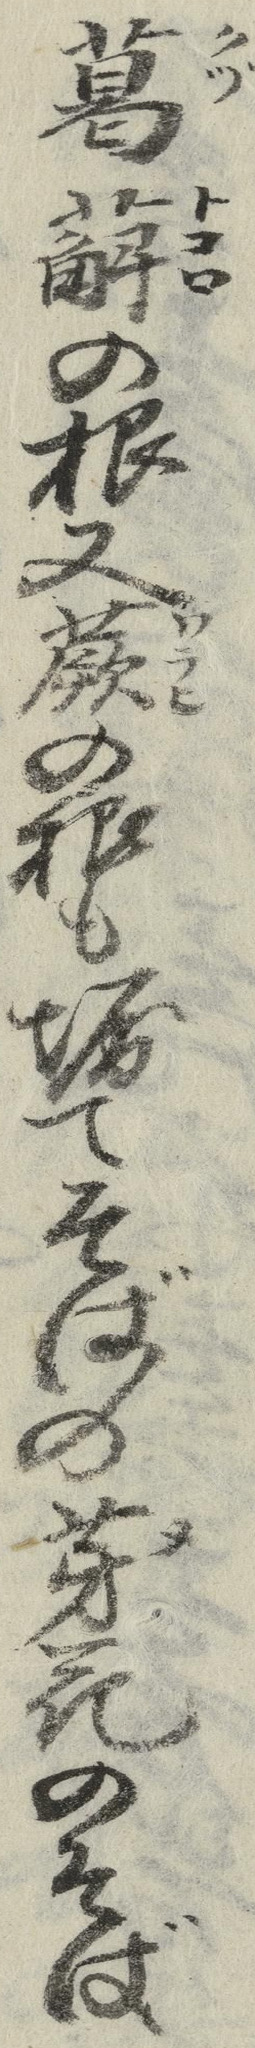葛薢の根又蕨の根も堀てそばの芽花のそば
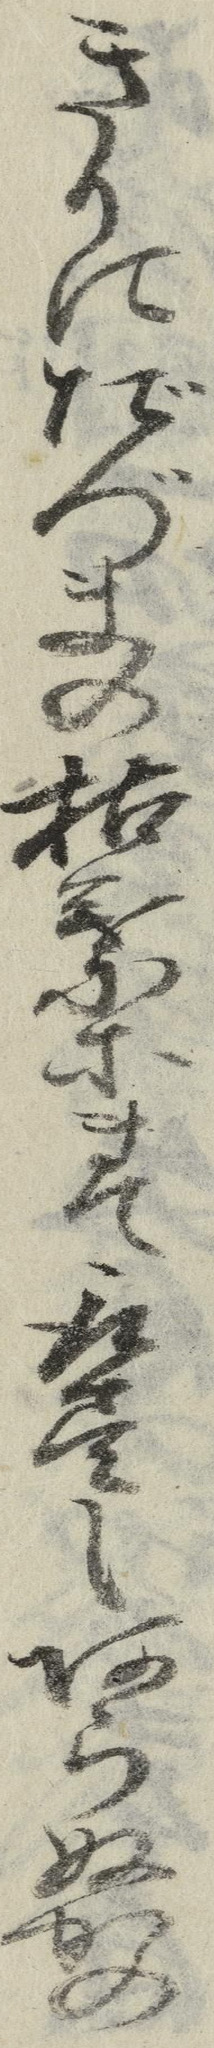きりにだづまの枯葉にまて取尽しあらぬかの
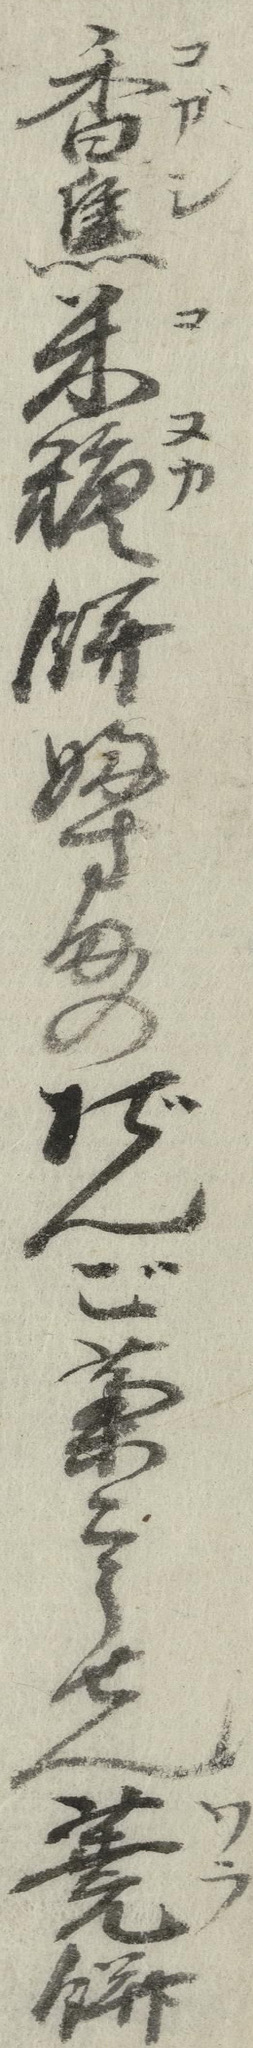香焦米糠餅ふすまのだんご蕈こらせん蕘餅
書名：浅間大焼騒動記　上
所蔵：東京大学地震研究所図書室 Earthquake Research Institute Library, The University of Tokyo, JAPAN
